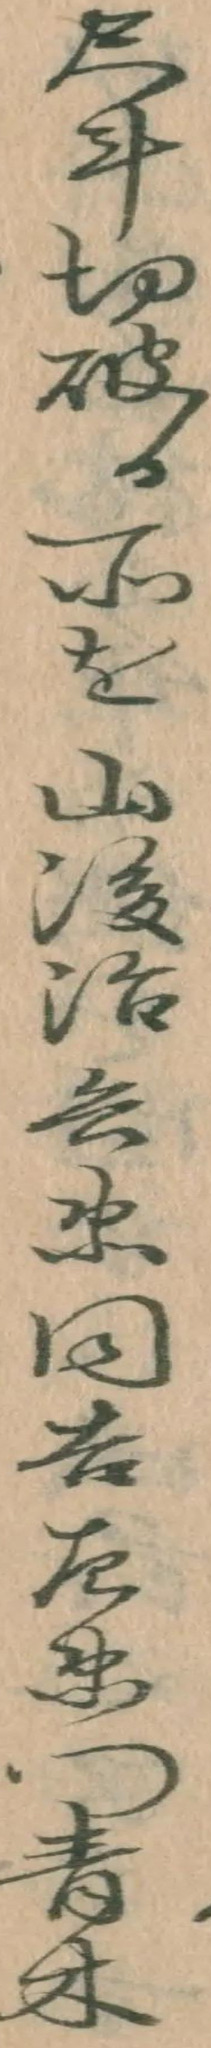尺斗切破る所を山後治兵衛同吉左衛門青木
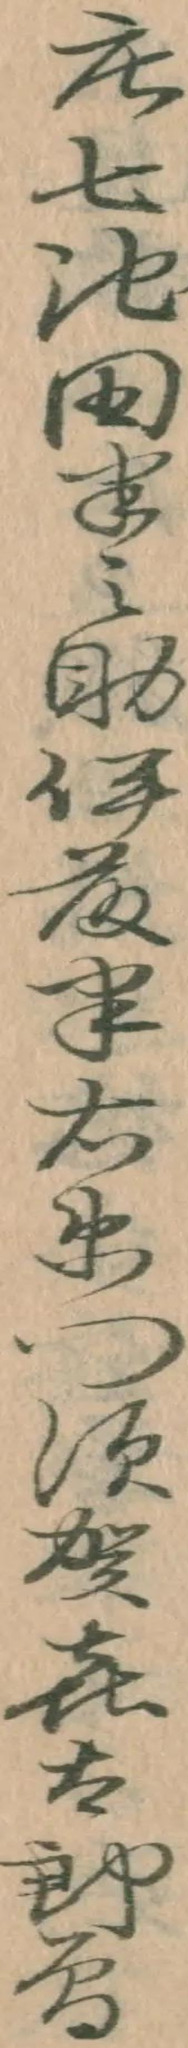庄七池田半之助伊藤半右衛門須賀喜太郎曽
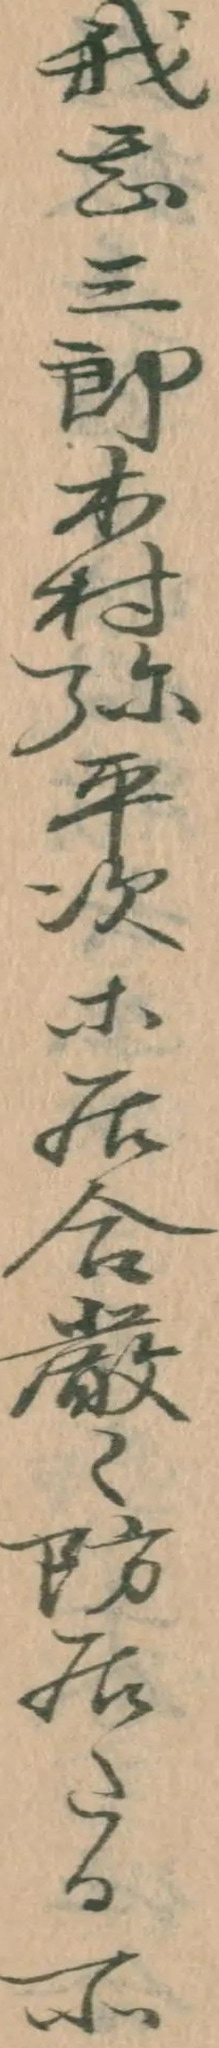我甚三郎木村弥平次等居合厳く防居たる所
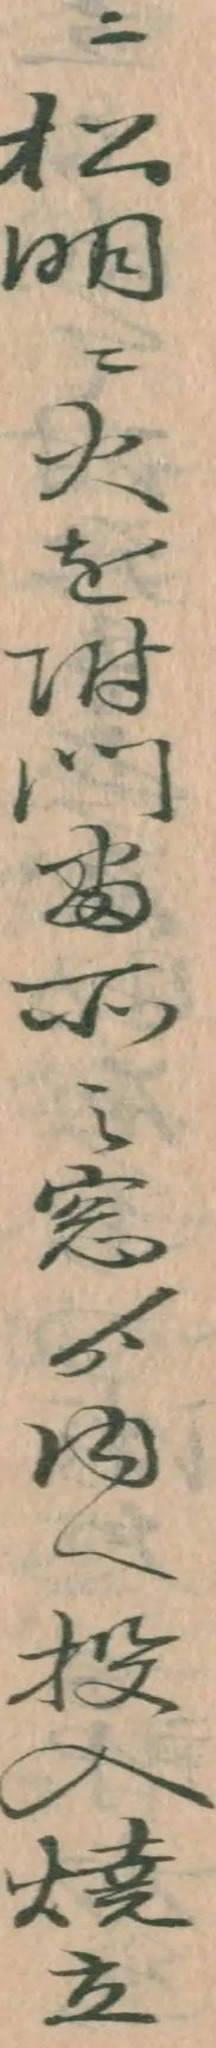に松明に火を附門番所之窓ゟ内へ投入焼立
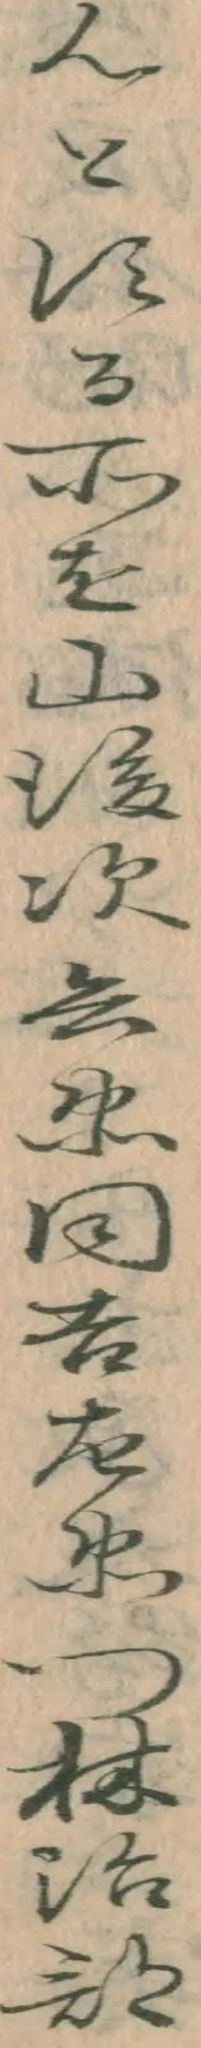んとする所を山後次兵衛同吉左衛門林治部
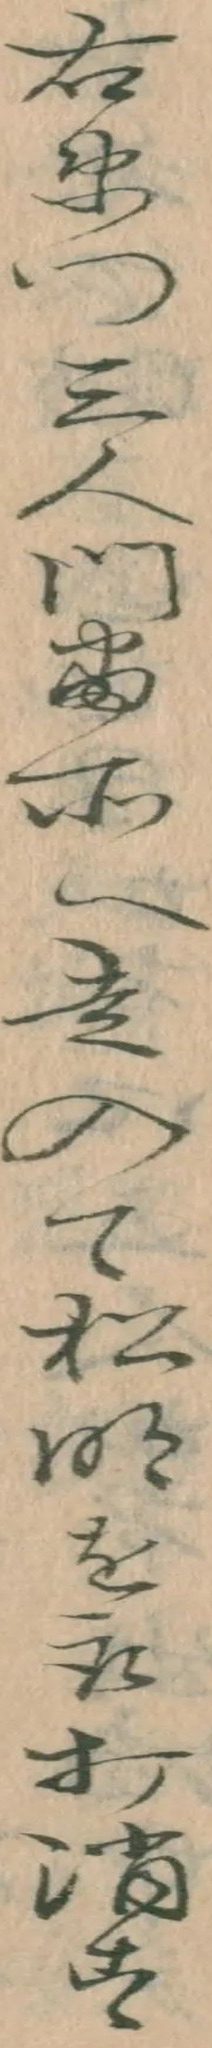右衛門三人門番所へ走入て松明を取打消す
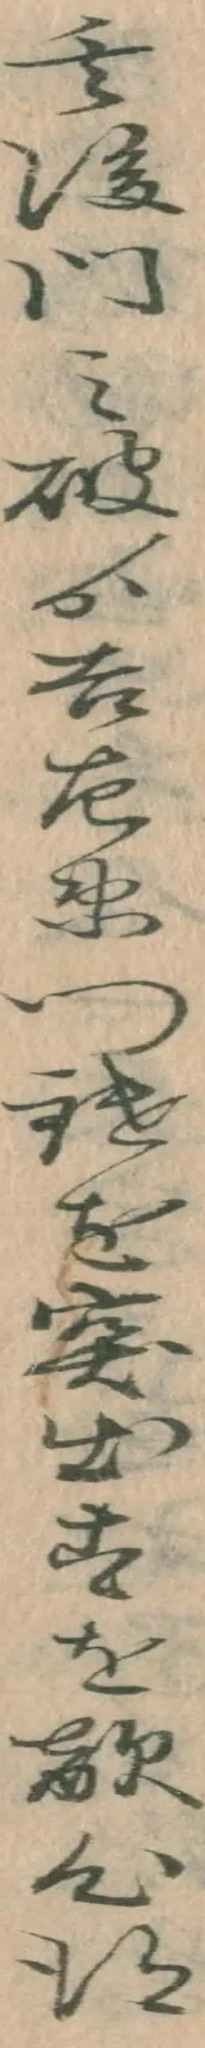其後門之破ゟ吉左衛門鑓を突出すを敵心得
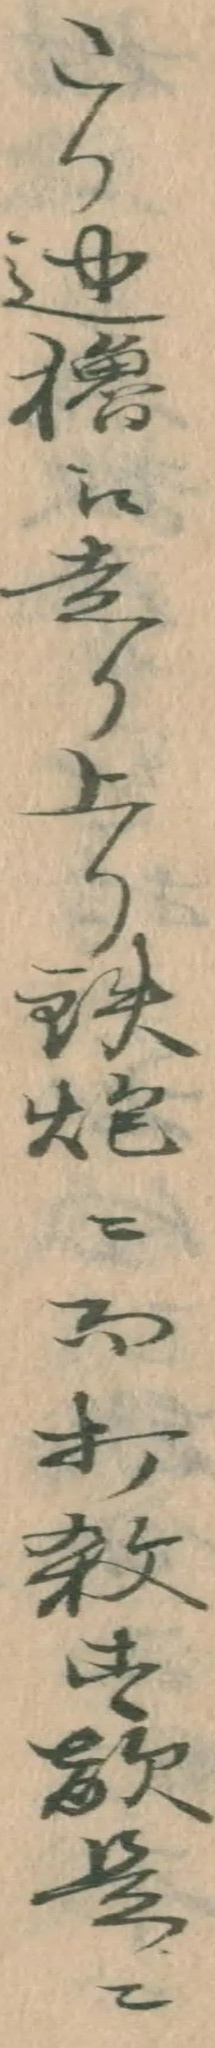たり迚櫓え走り上り鉄炮に而打殺す敵是に
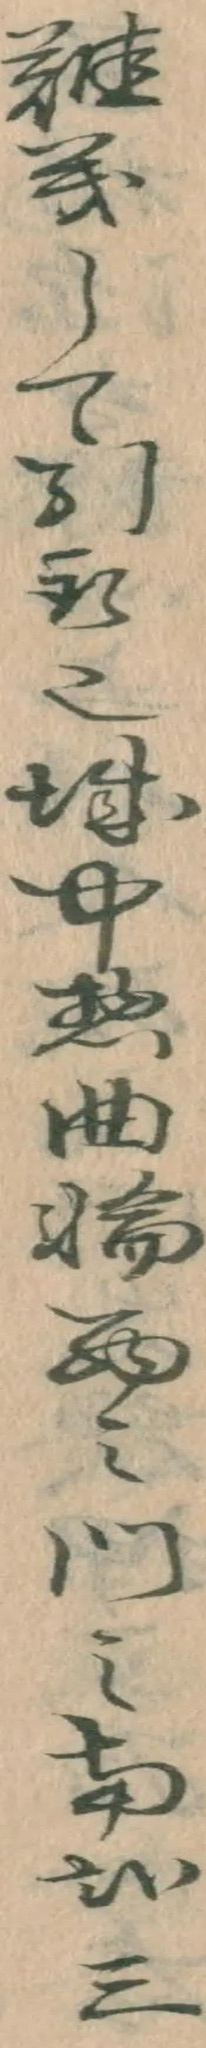難義して引取也城中惣曲輪西之門之南弐三
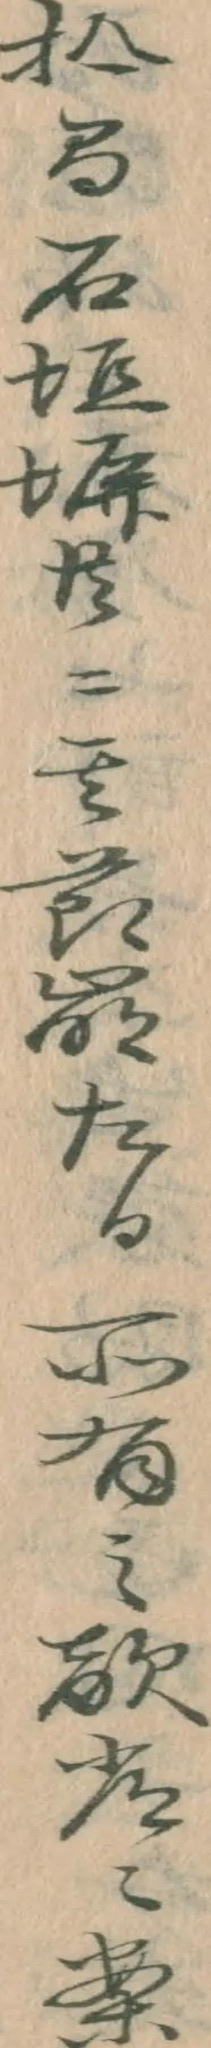拾間石垣塀共に其節崩たる所有之敵常に案
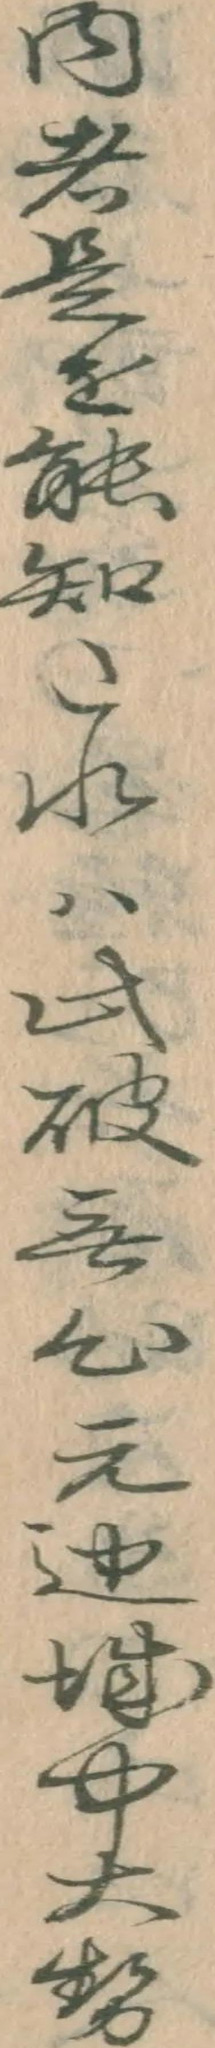内者是を能知たれは此破無心元迚城中大勢
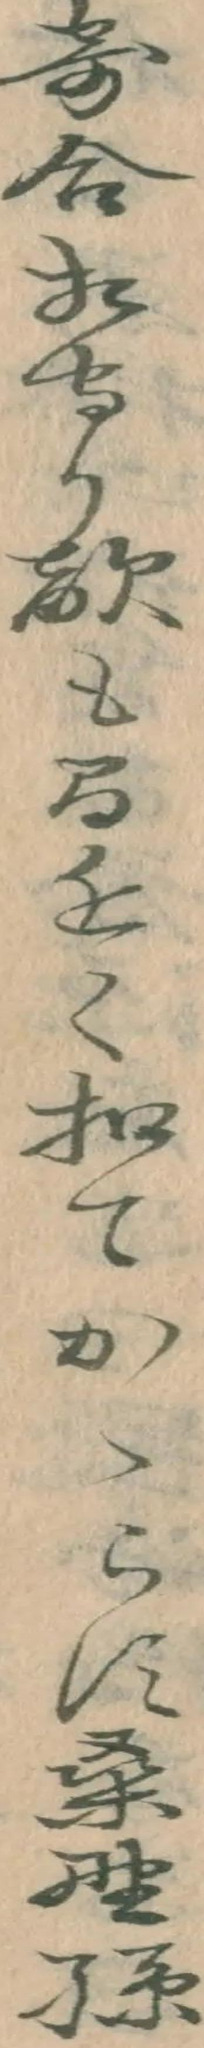寄合相守り敵も間近く扣てかゝらす桑野孫
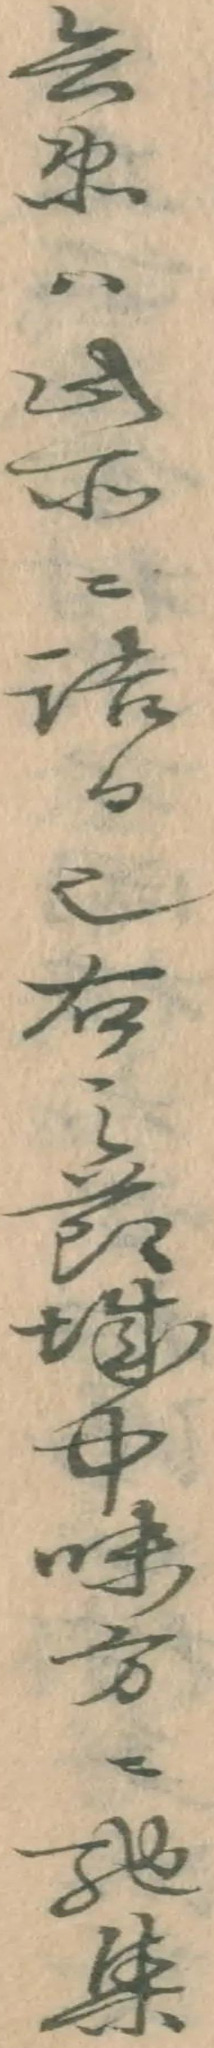兵衛は此所に詰る也右之節城中味方に馳集

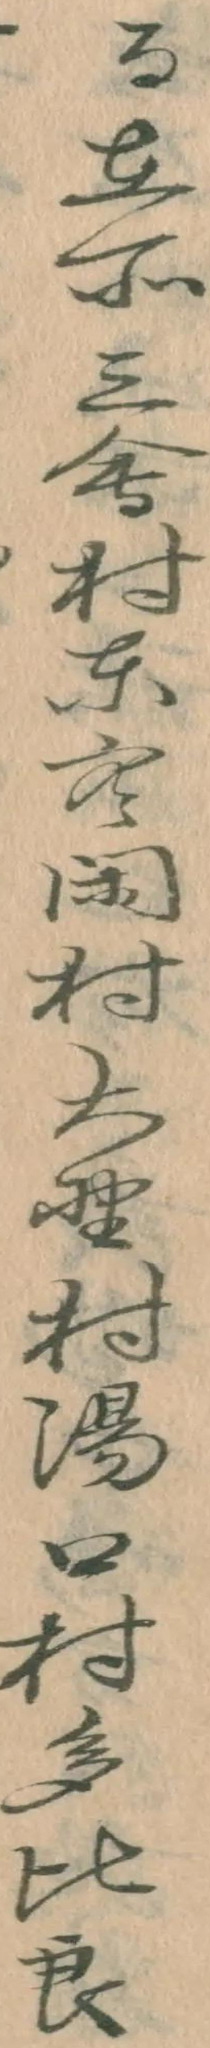る在所三会村東空閑村大野村湯口村多比良
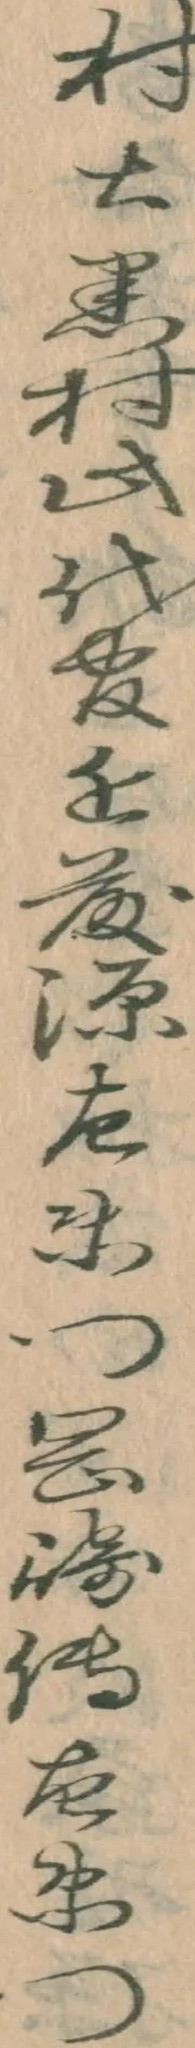村土黒村此代官近藤源左衛門岡崎伝左衛門
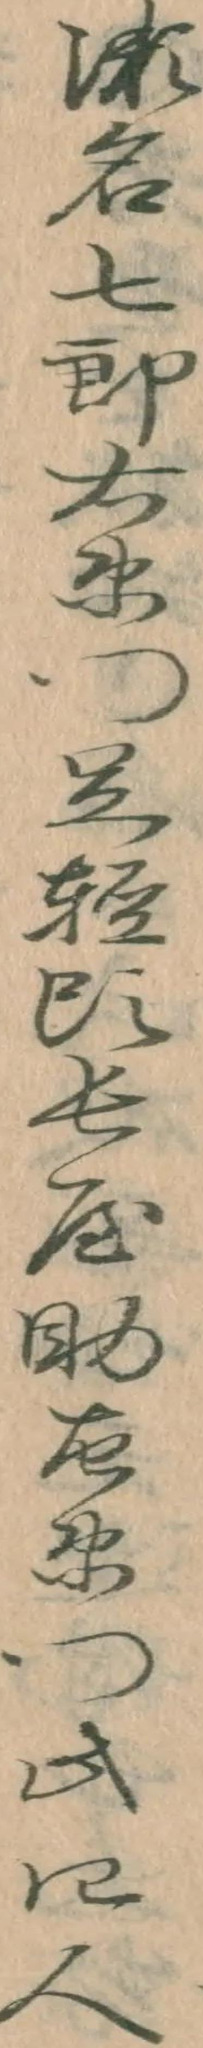瀬名七郎右衛門足軽頭長屋助左衛門此四人
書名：切支丹御退治記 49巻. [1]
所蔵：国立国会図書館 National Diet Library, JAPAN
